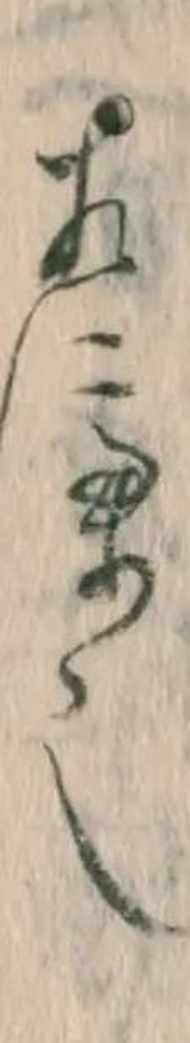相渡也
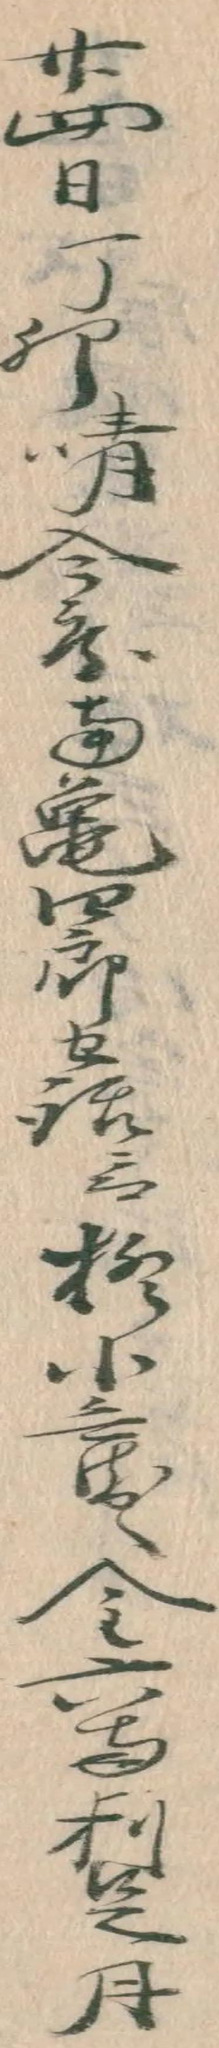廿四日丁卯晴今度南亀四郎世話ニ而柊小兵衛へ金六両利足月
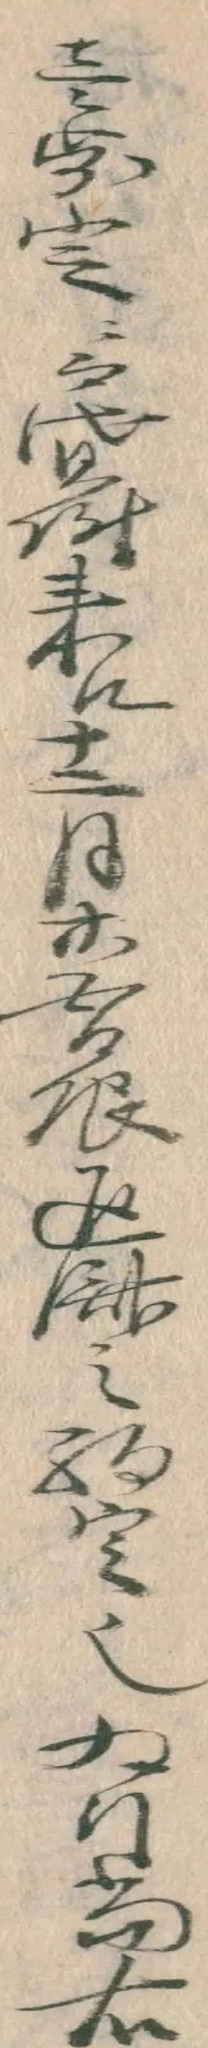壱歩定ニ而貸附来ル十二月廿五日限追済之約定也為引當右
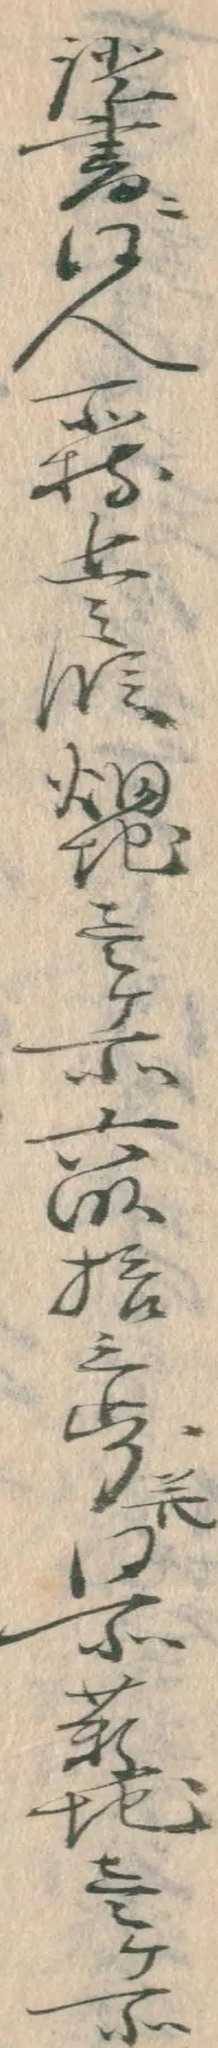證書ニ同人所持上之段畑地壱ヶ所六畝拾三歩并同所薪地壱ケ所
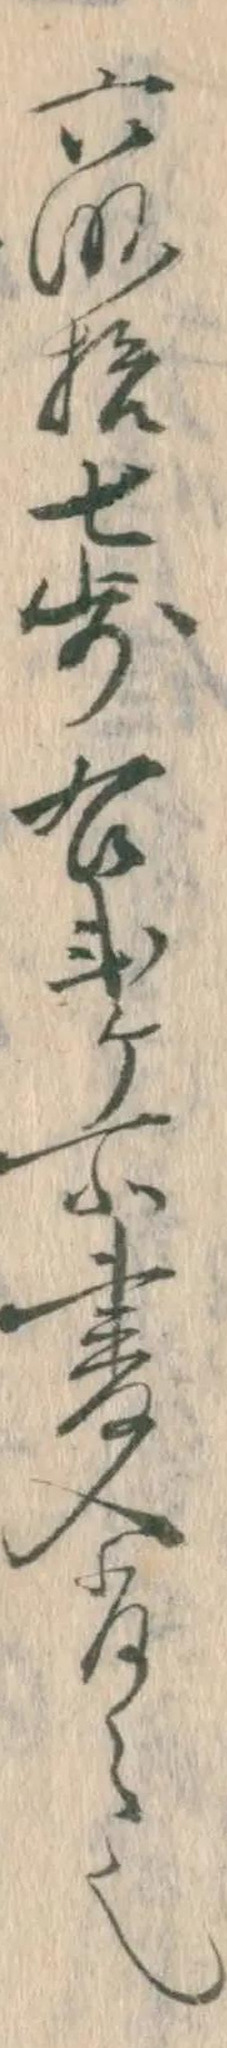六畝拾七歩右弐ヶ所書人有之也
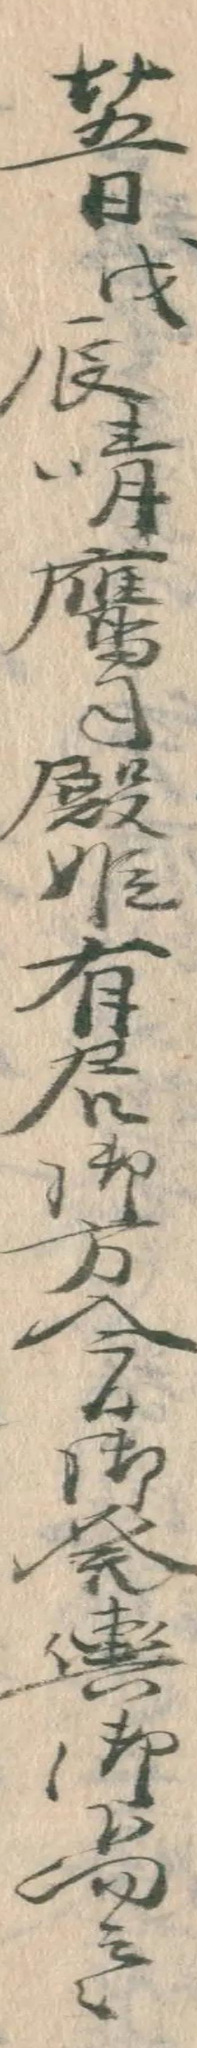廿五日戊辰晴鷹司殿姫有君御方今日御発輿御下向云々
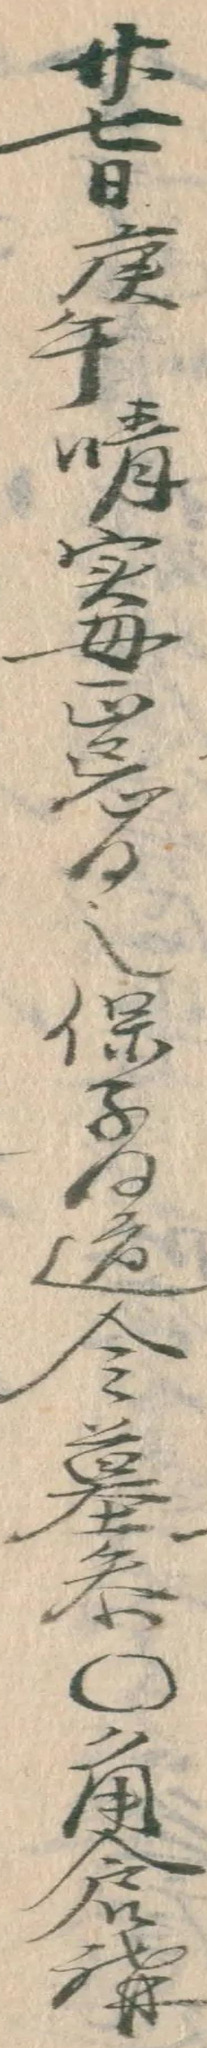廿七日庚午晴実母正忌日也保子同道令墓参○角倉講
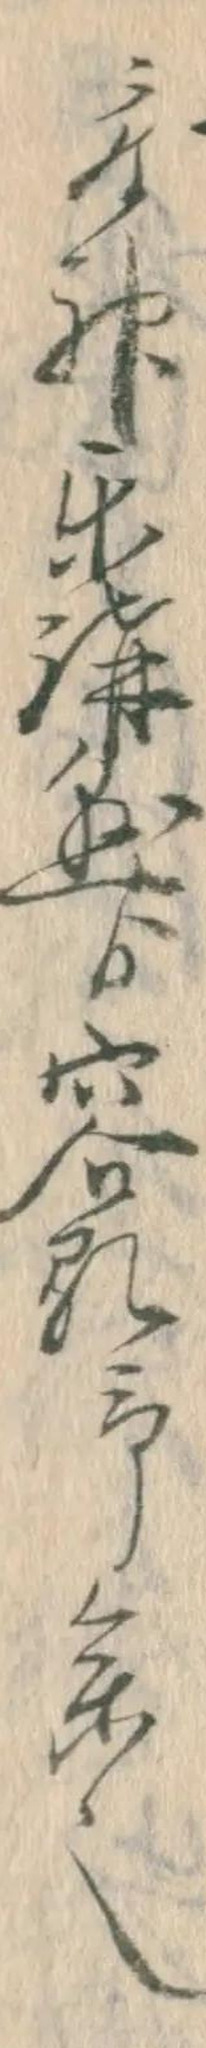ニ付神楽講懸ゟ容顕予参也

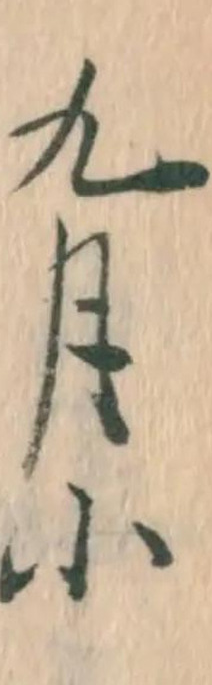九月小
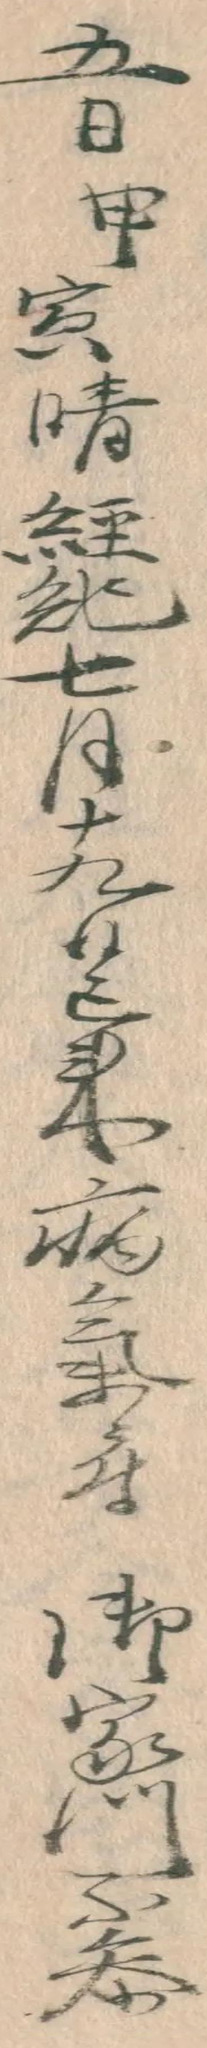五日甲寅晴経紀七月十九日已来病氣ニ付御家門不参
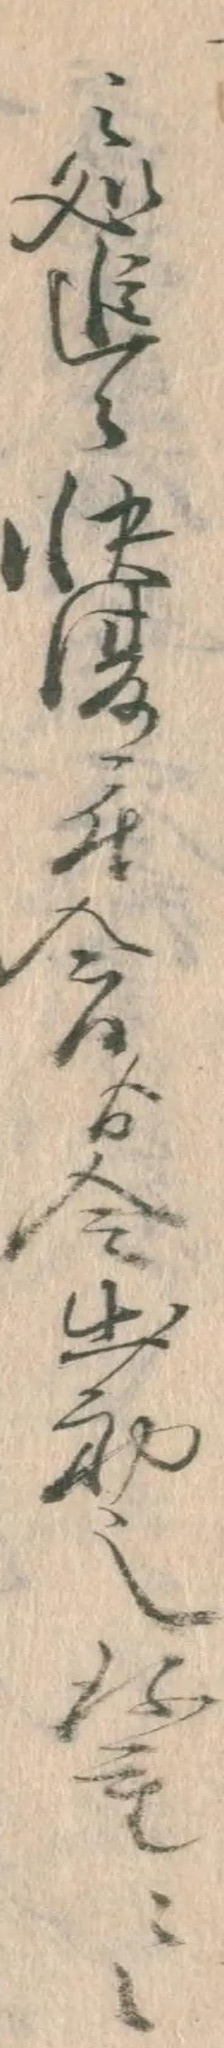之処追々快復ニ付今日ゟ令出勤也珍重々々
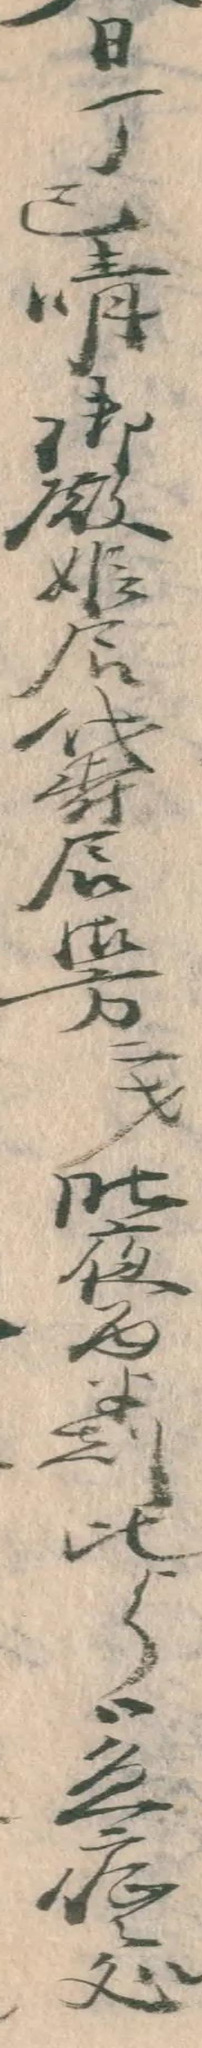八日丁巳晴御殿姫君代壽居御方ニ才昨夜酉半刻比より御急病之処
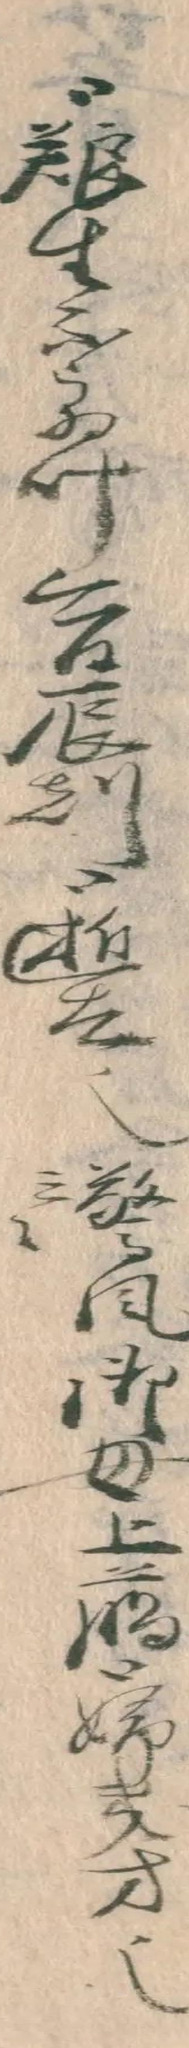御養生不被為叶今日辰刻御逝去也讃風御母上臈御婦父方也
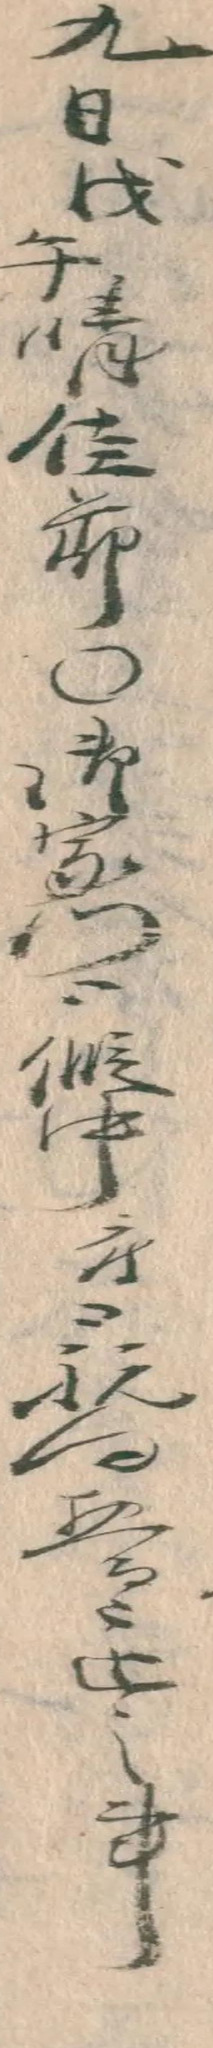九日戊午晴佳節○御家門御仮中ニ付御祝向惣而被止之事
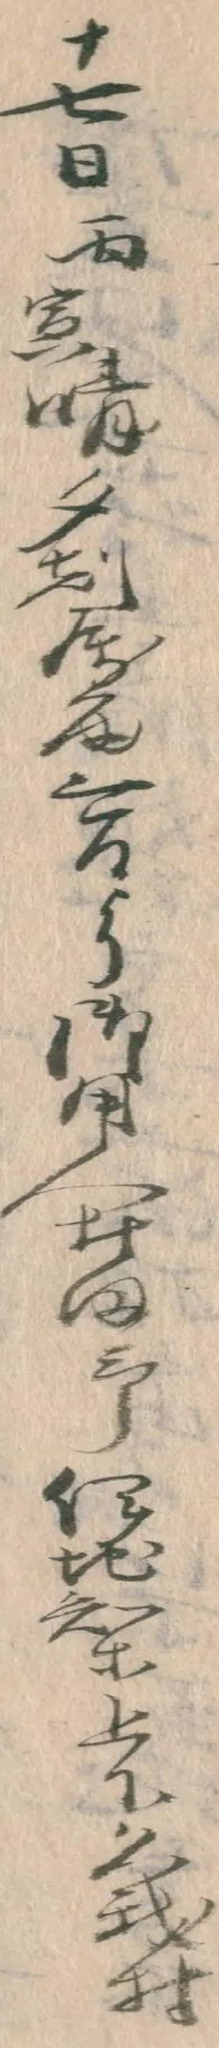十七日丙寅晴夕刻属届今日より御用人村田予伊地知等上下久我村
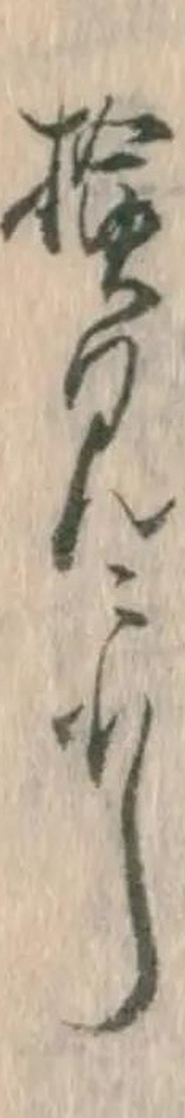検見ニ行
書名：賀茂社記録. 第66冊
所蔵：国立国会図書館 National Diet Library, JAPAN
